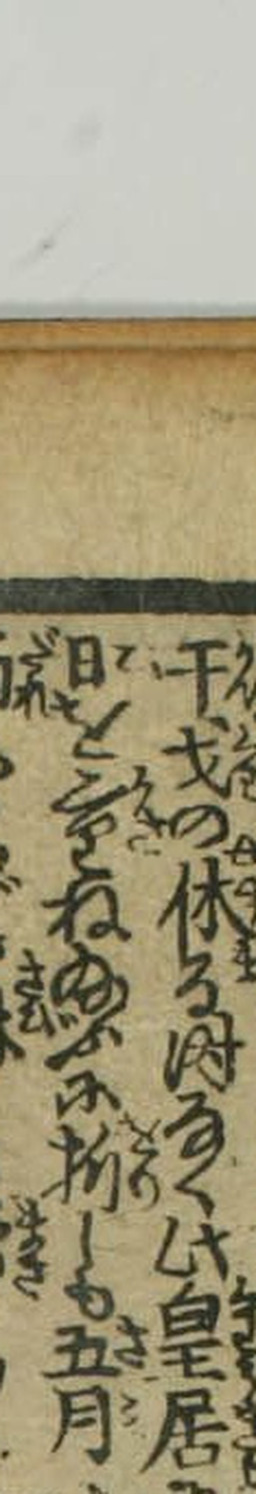日を重ね給ふに折しも五月
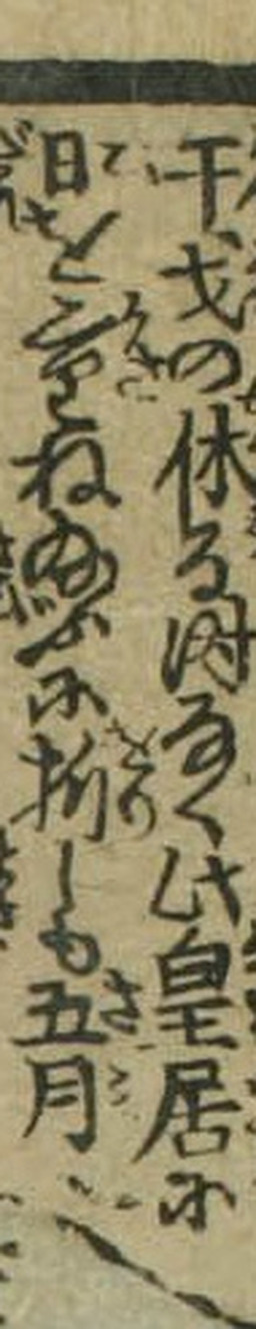日を重ね給ふに折しも五月
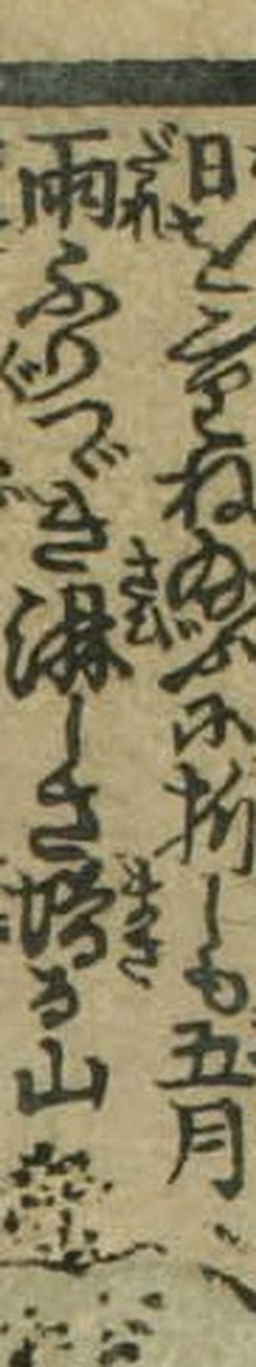雨ふりつゞき淋しさ増る山
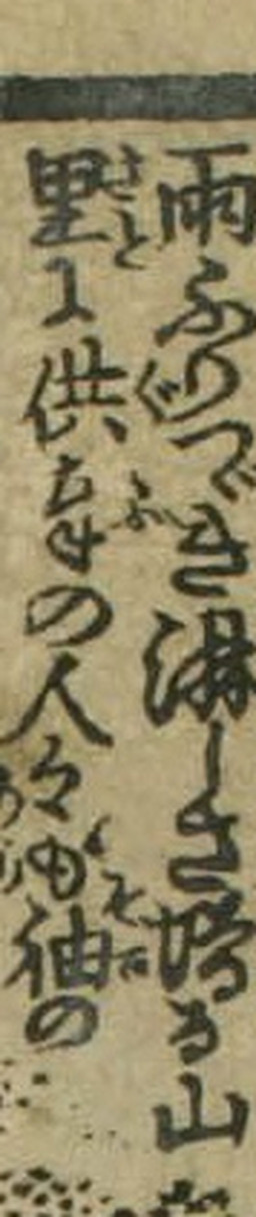里に供奉の人々も袖の
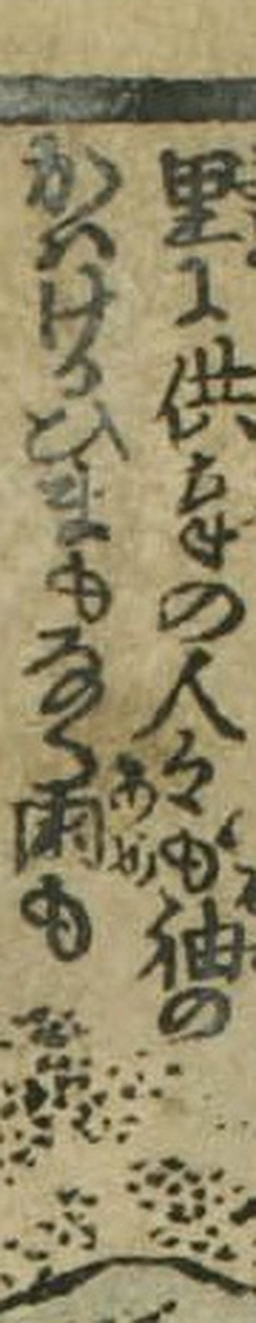かはけるひまもなく雨も
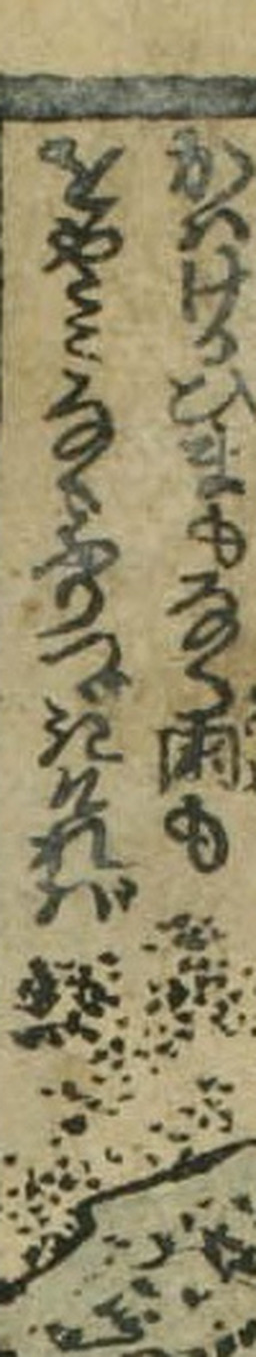をやみなくふりつゞきければ
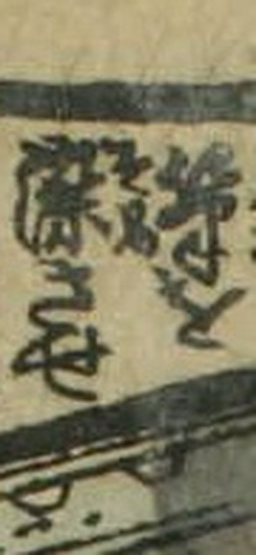染させ
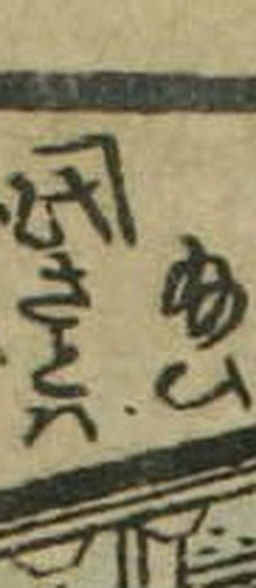〽此さとは
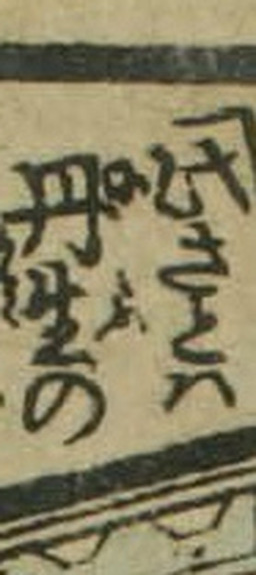丹生の
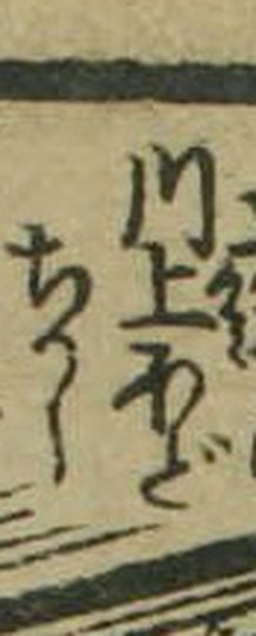ちかく
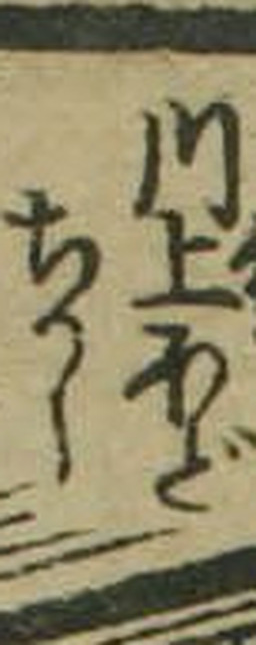ちかく
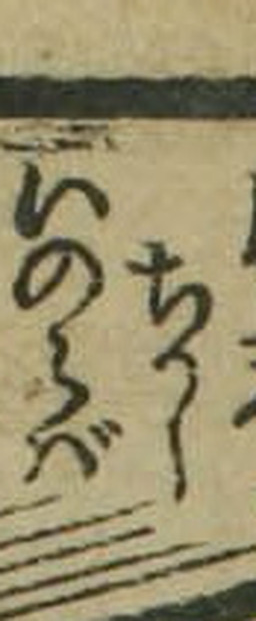いのらば
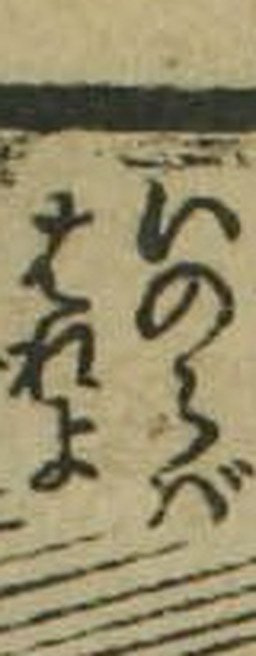はれよ
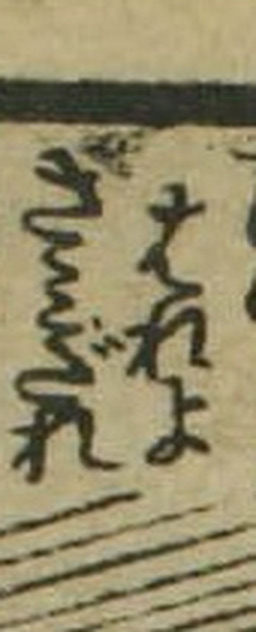さみだれ
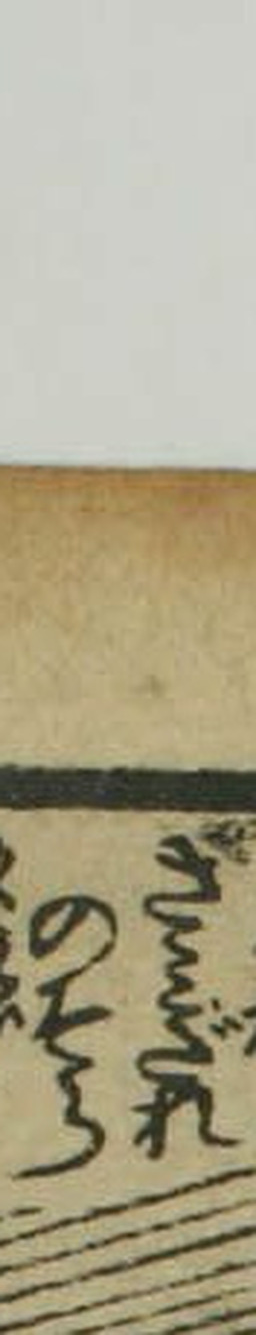のそら
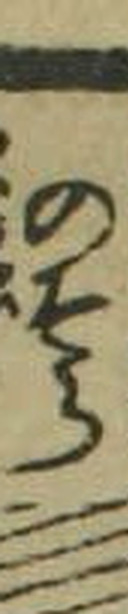のそら
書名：續英雄百人一首
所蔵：東京学芸大学附属図書館
